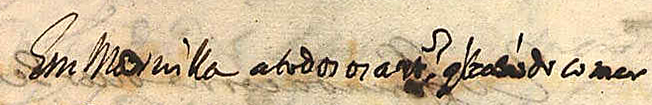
Em Maruilla a todos os art.os q̄ trataõ do comer
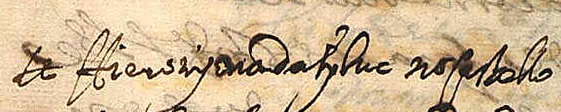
Item Hieronyma da Sylua no Castello
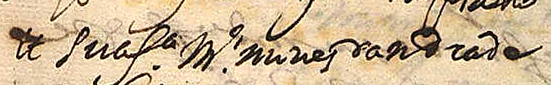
Item Sua f.a M.a Nunes dandrade
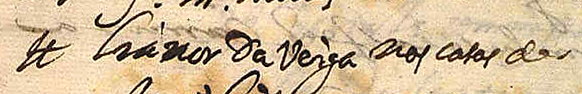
Item lianor da Veiga nas casas de
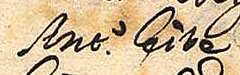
Ant.o leite
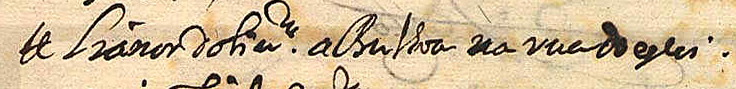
Item Lianor doliu.ra. a Bulhoa na rua do escri
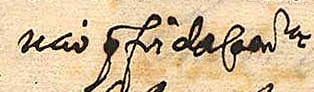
uaõ q̄ foi da Cam.ra
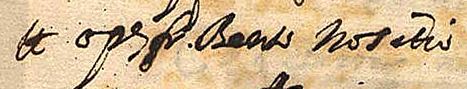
Item o pe fr. Bento no Set̄io
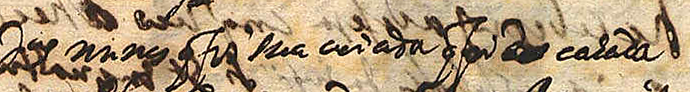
Item D.as nunes q̄ foi sua criada q̄ foi _ casada
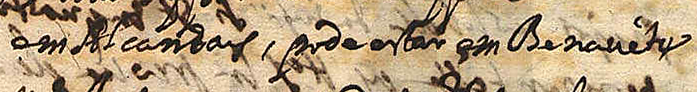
em Alcanhais, pode estar em Benauēto
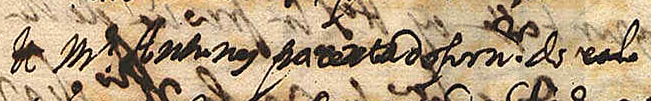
Item M.a Antunes parenta do forn.ro do cal
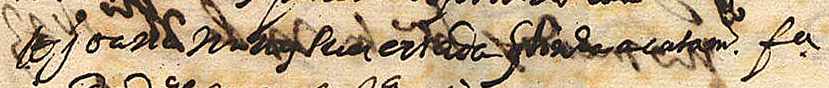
Item joana nunes sua criada q̄ tinha a casam.to f.a
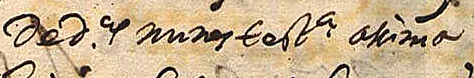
de d.as nunes tes.ta assima
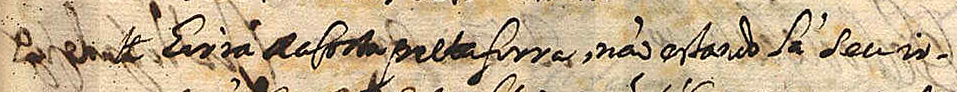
Item Eriza da Costa preta forra, naõ estando lá seu ir
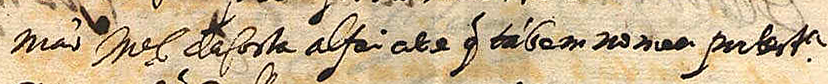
mão Mel da Costa alfaiate q̄ tābem nomea por test.a
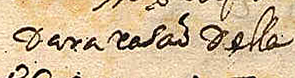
Dar a rasaõ dela
